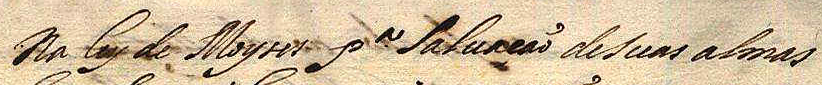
na ley de Moyses pa. saluaçaõ de suas almas
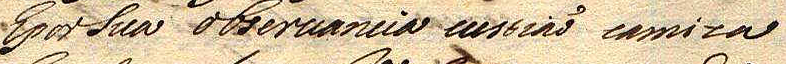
E por sua obseruancia uestiaõ camiza
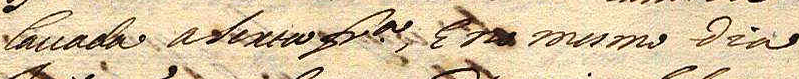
lauada a sexta fr.a, E no mesmo dia
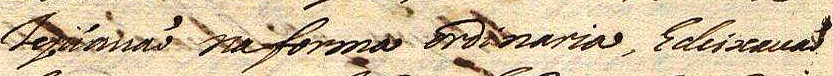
Iejuauaõ na forma ordinaria, E deixauaõ
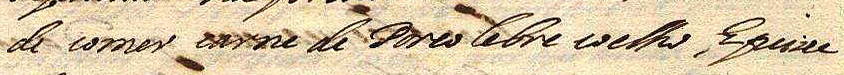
de comer carne de Porco lebre coelho, E peixe
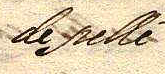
de pelle
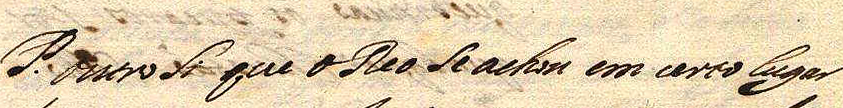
P. outrosi que o Reo se achou em certo lugar
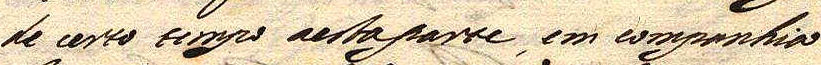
de certo tempo a esta parte em companhia
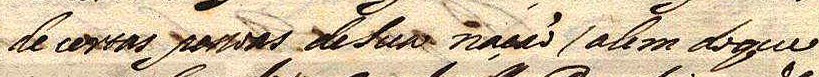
de certas pessoas de sua naçaõ / alem do que
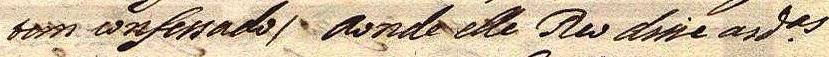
tem confessado / aonde elle Reo disse as d.as
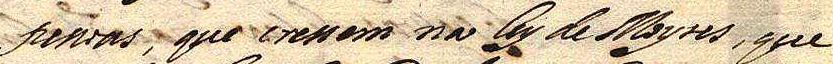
pessoas, que cressem na ley de Moyses, que
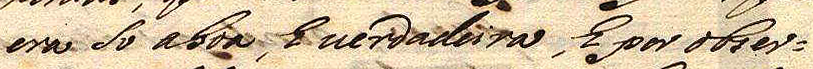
era so a boa, E uerdadeira, E por obser
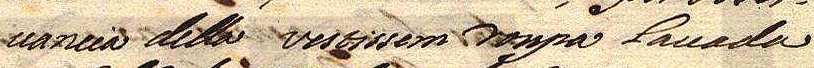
uancia della vestissem roupa lauada
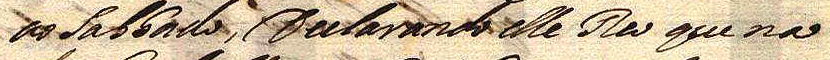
ao sabbado, Declarando elle Reo que na
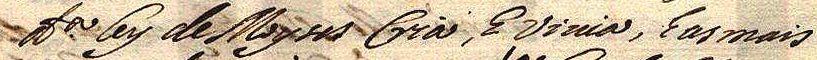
d̄.a ley de Moyses Cria, E viuia, E as mais
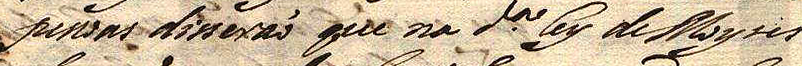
pessoas disseraõ que na d.a ley de Moyses
